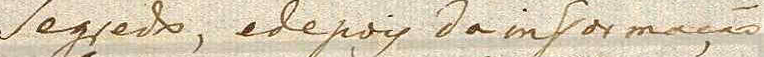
segredo, e depois da informação
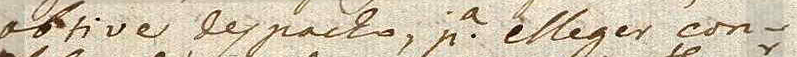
obtive despacho, p.a elleger con
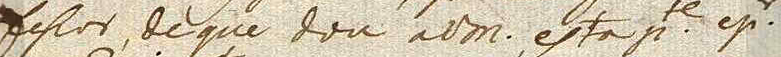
fessor, de que dou a vm. esta p.te e p.r
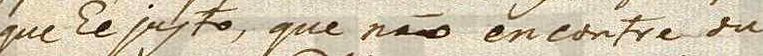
que he justo, que não encontre ou
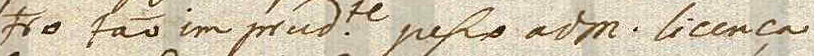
tro tão imprudente peço a vm. licença
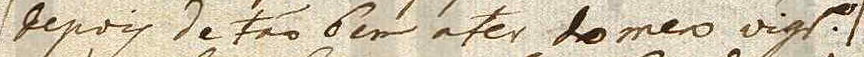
/ depois de tãobem a ter do meo vigr.o /
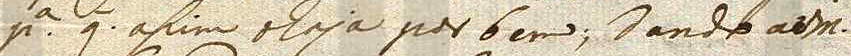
p.a q̄ assim o haja por bem; dando a vm.
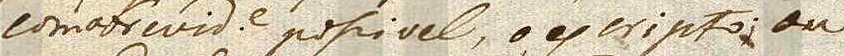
com a brevid.e possivel, o escripto; ou
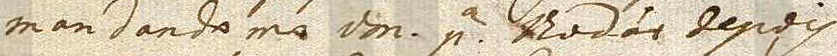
mandando mo vm. p.a lho dar depois
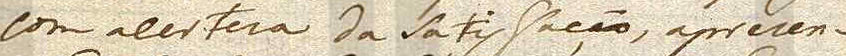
com a certeza da satisfação, aprezen
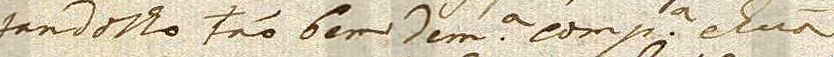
tando lho tão bem de m.a comp.a e huā
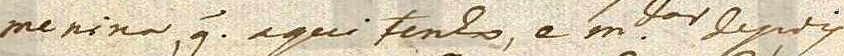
menina, q̄ aqui tenho, e m.dar depois
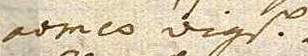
ao meo vigr.o
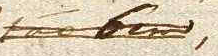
tãobem
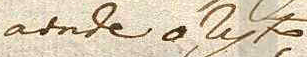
, aonde o Resto
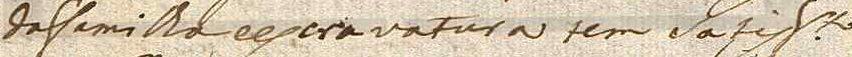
da familha e escravatura tem satisf.to
